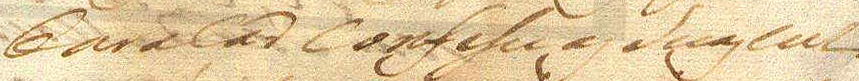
baraçar confesse as suas cul
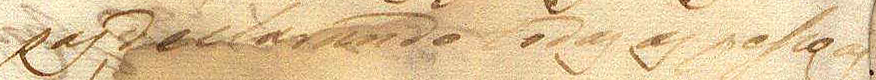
pas, declarando todas as pessoas
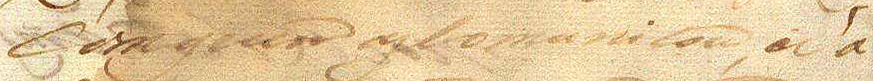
com quem as comunicou, e Sa
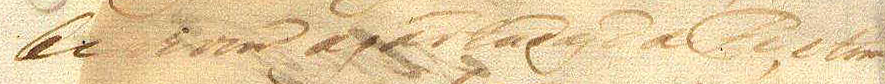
be vivem apartadas da Fe, e tem
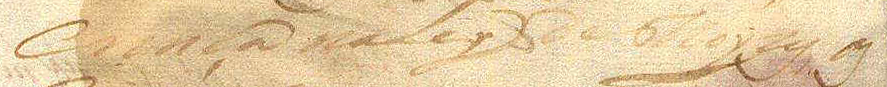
crença na Ley de Moyses, os
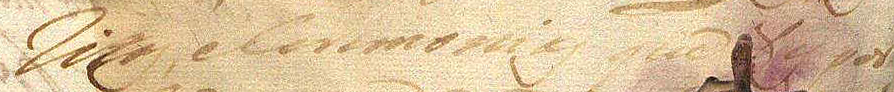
Ritos, e ceremonias que _les por
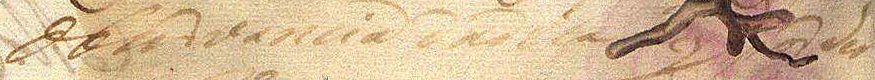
observancia da dita _ey por ser
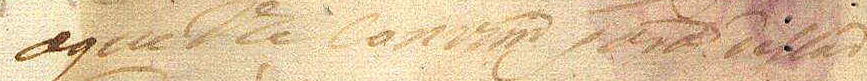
o que lhe convem para descar
